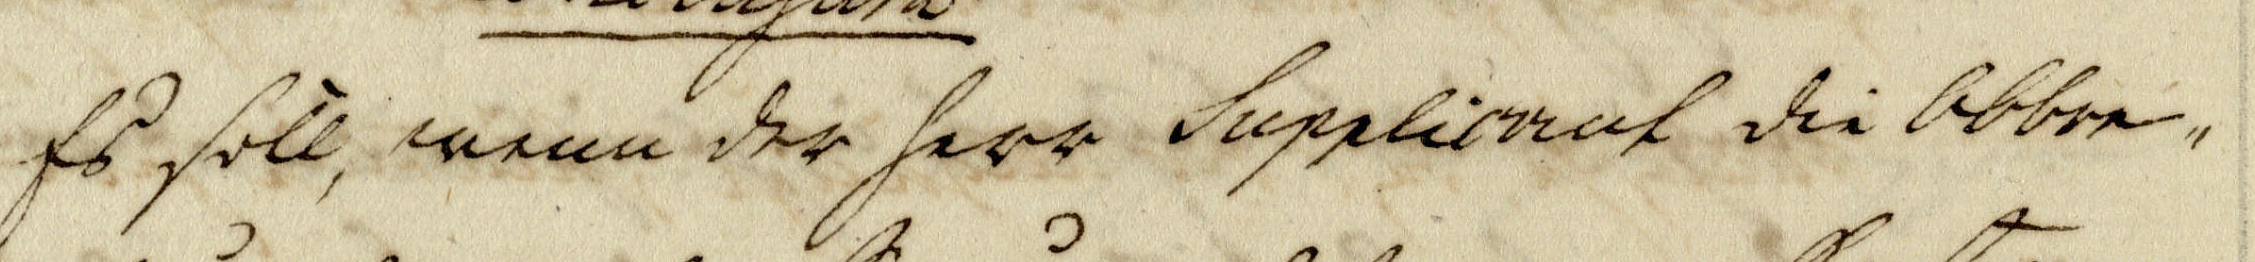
Es soll, wenn der Herr Supplicant die Abbre¬
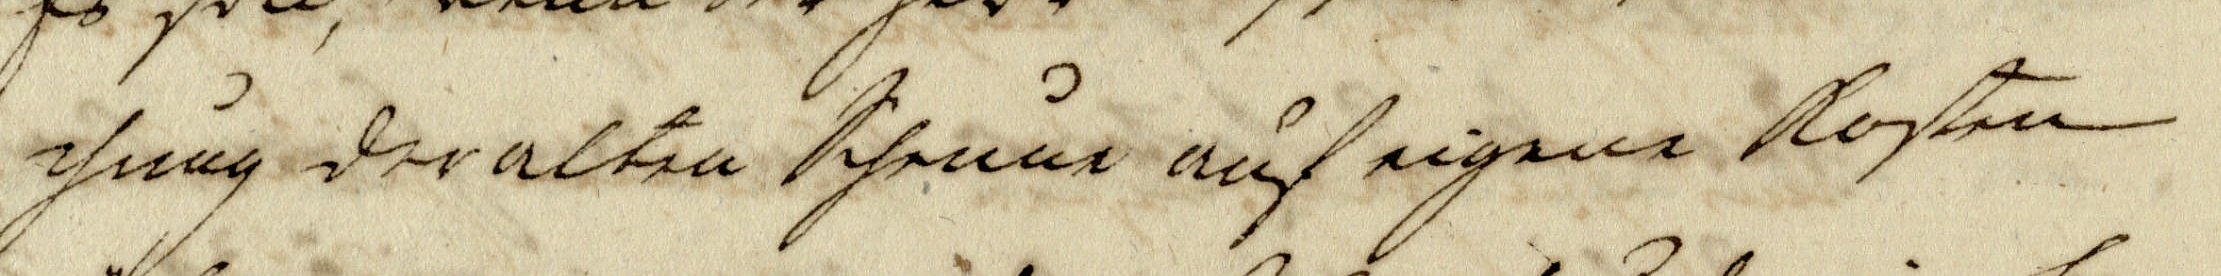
chung der alten Scheune auf eigene Kosten
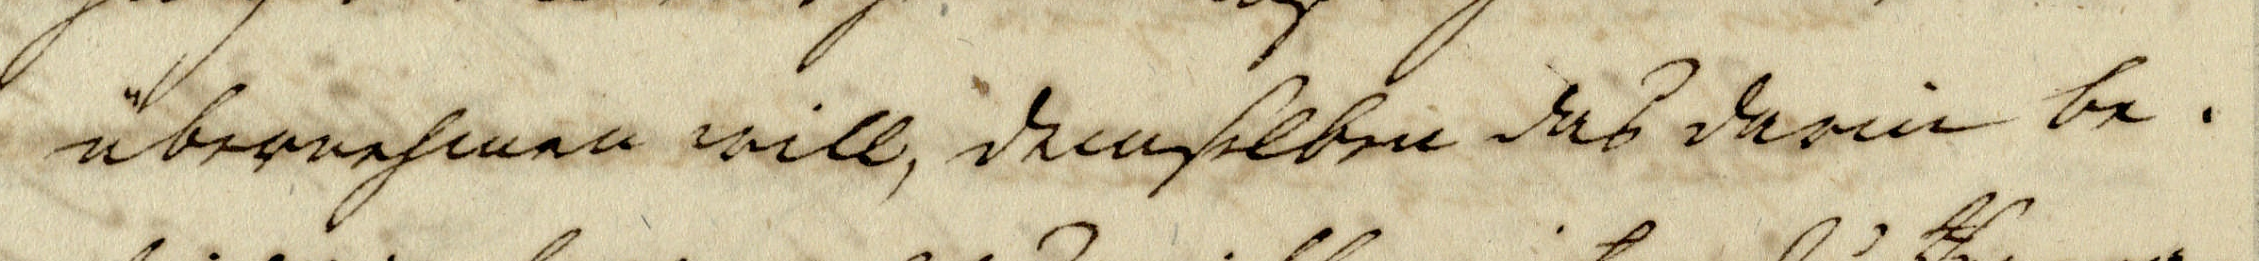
übernehmen will, demselben das darin be¬
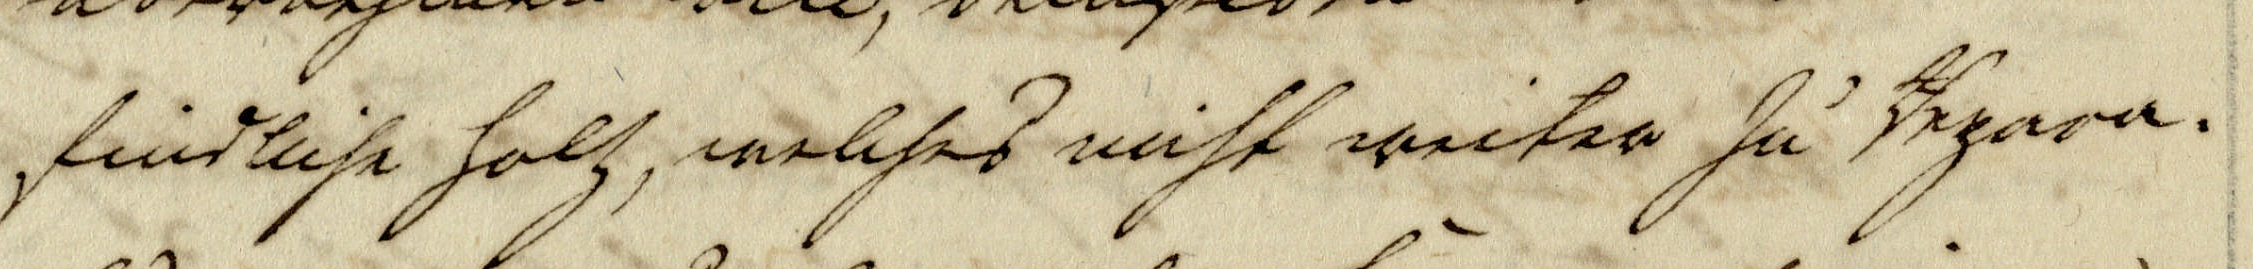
findliche Holz, welches nicht weiter zu Repara¬
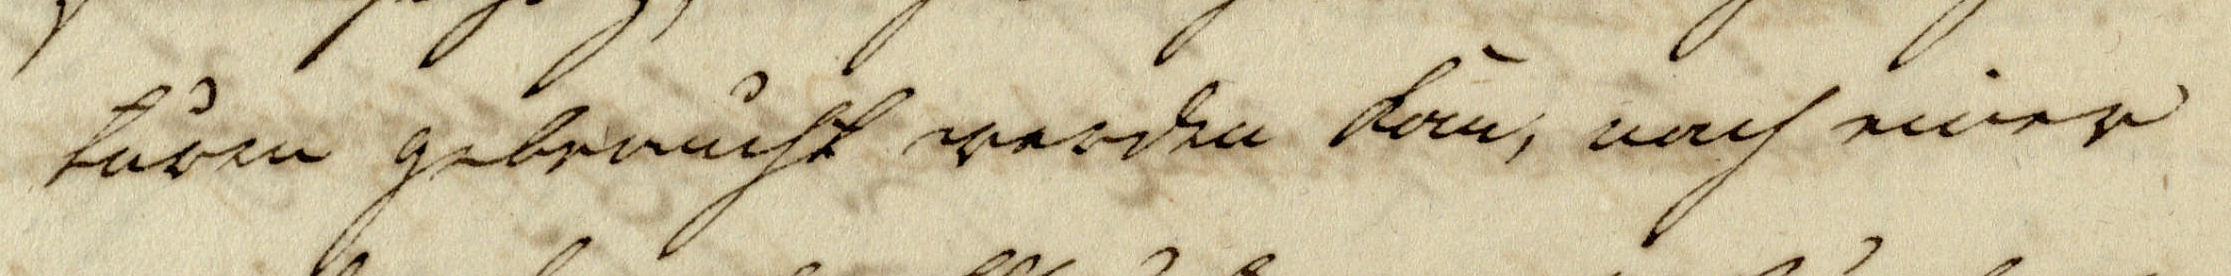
turen gebraucht werden kan, nach einer
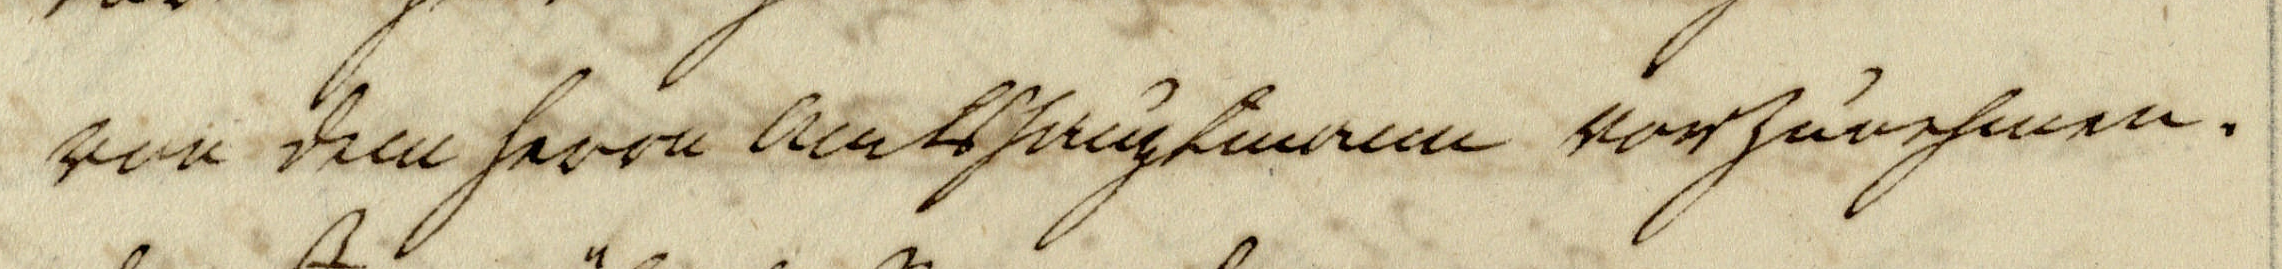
von dem Herrn Amtshauptmann vorzunehmen¬
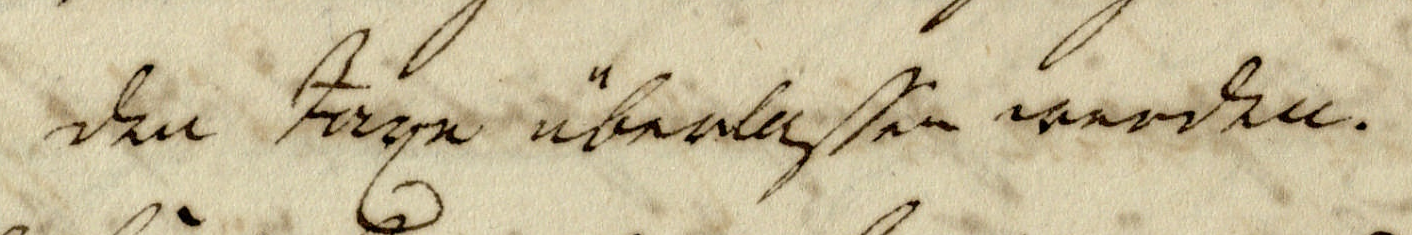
den Taxe überlassen werden.
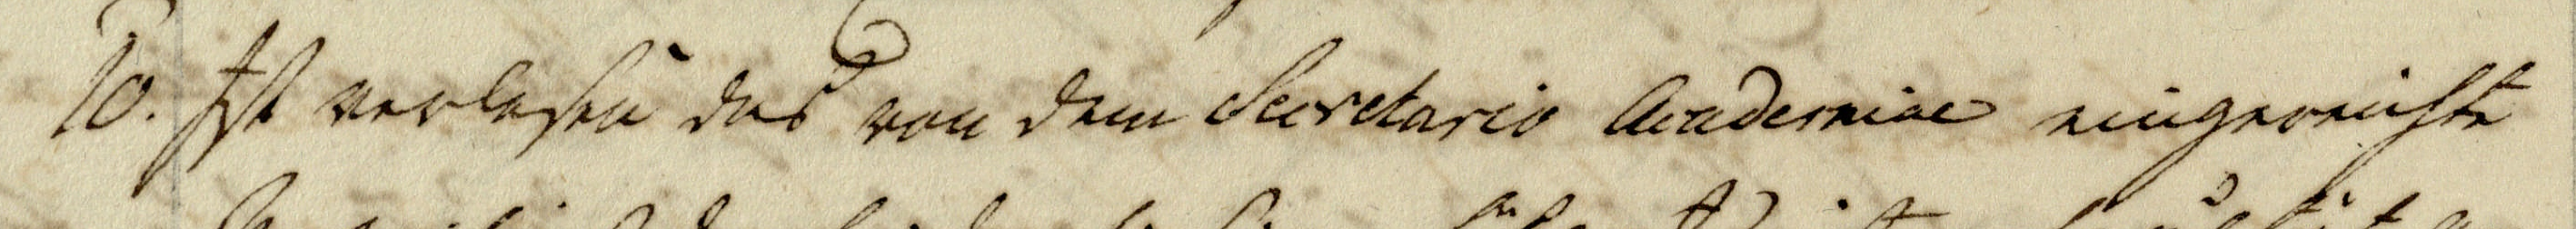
10. Ist verlesen das von dem Secretario Academiae eingereichte
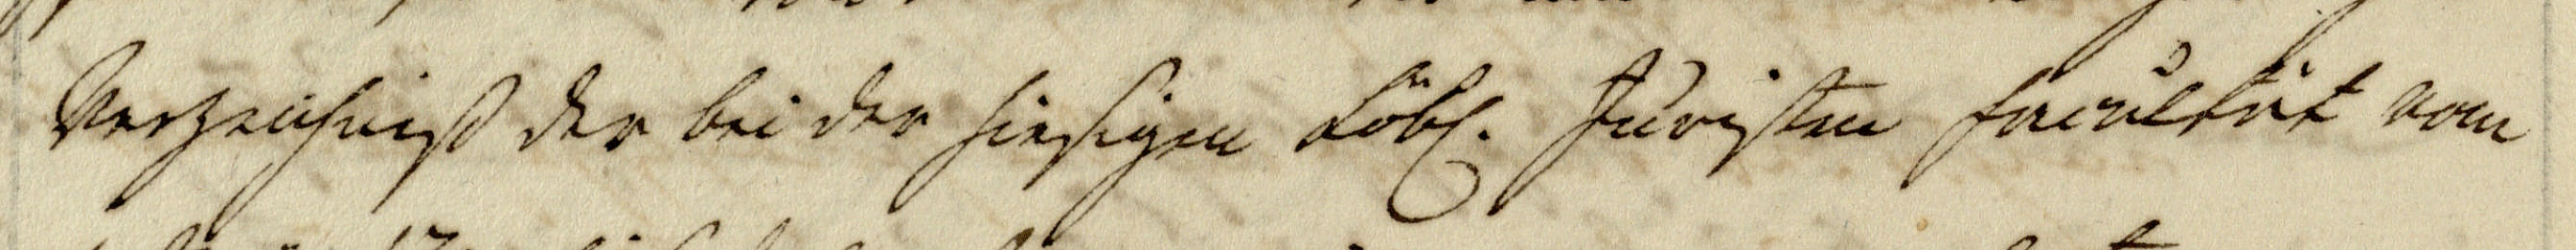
Verzeichniß der bei der hiesigen Löbl. Juristen Facultät vom
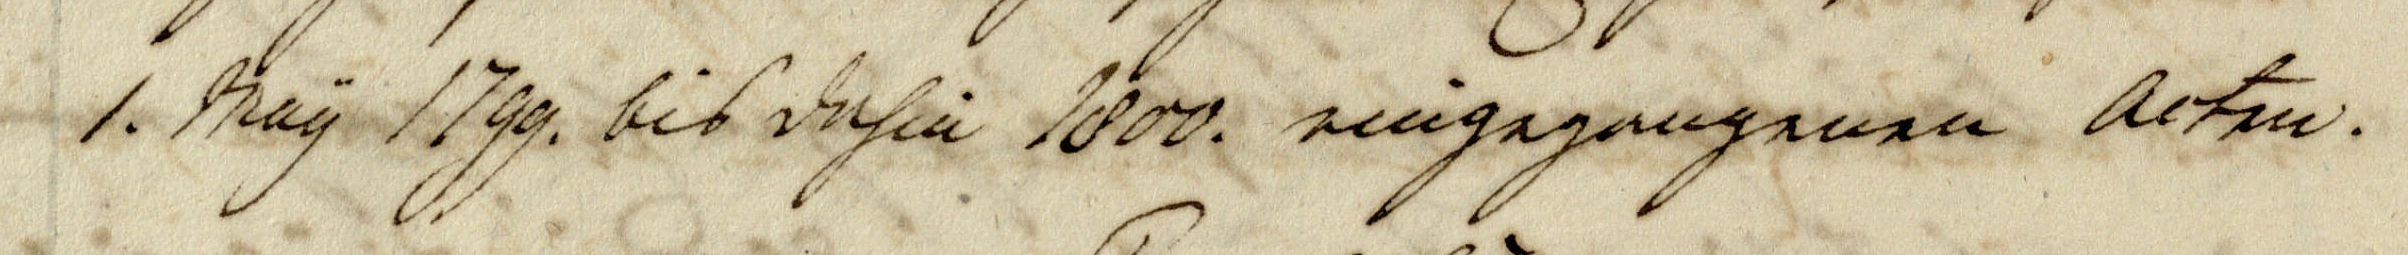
1. Maÿ. 1799. bis dahin 1800. eingegangenen Acten.
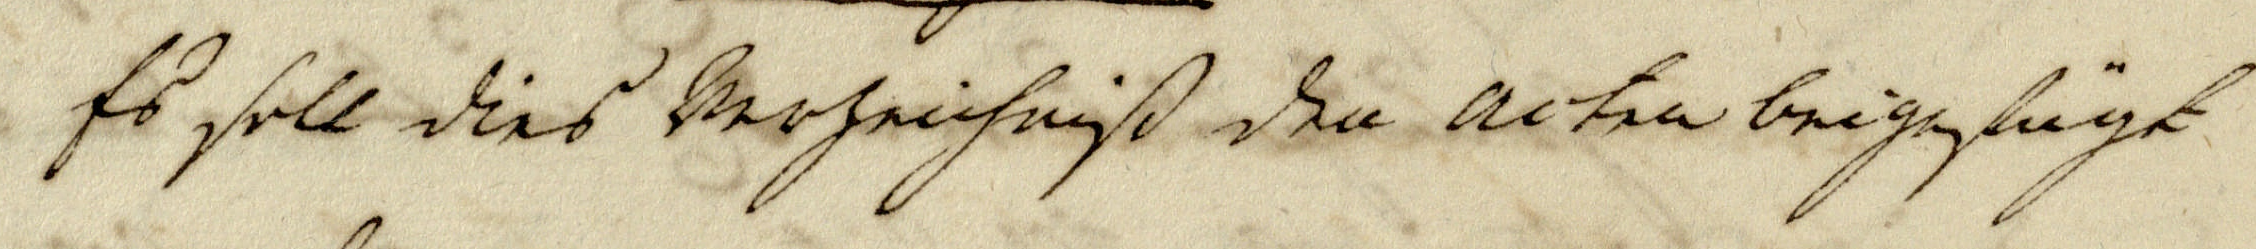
Es soll dies Verzeichniß den Acten beigefügt
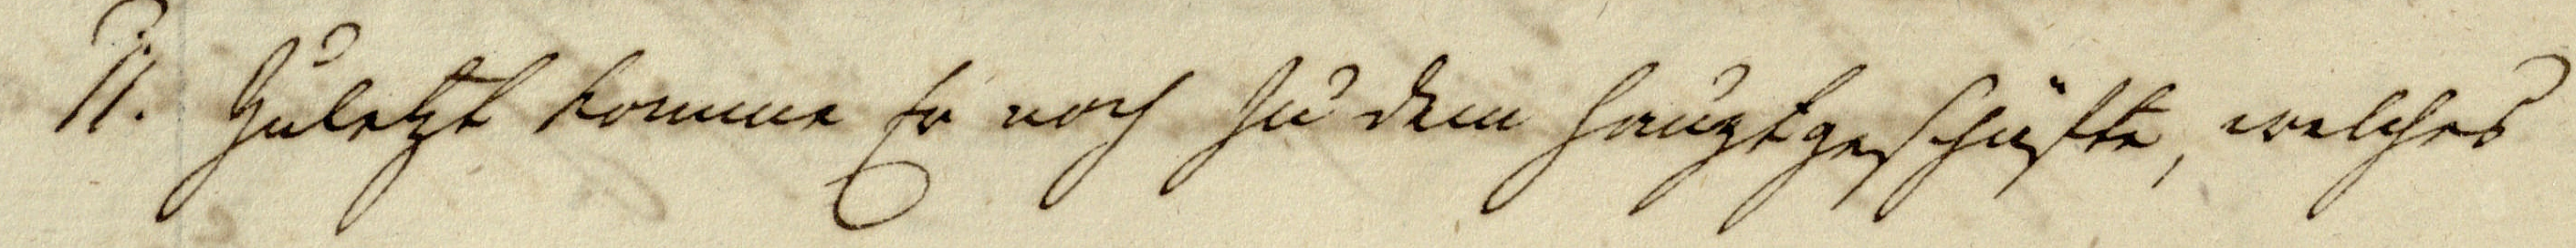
11. Zuletzt komme Er noch zu dem Hauptgeschäfte, welches
